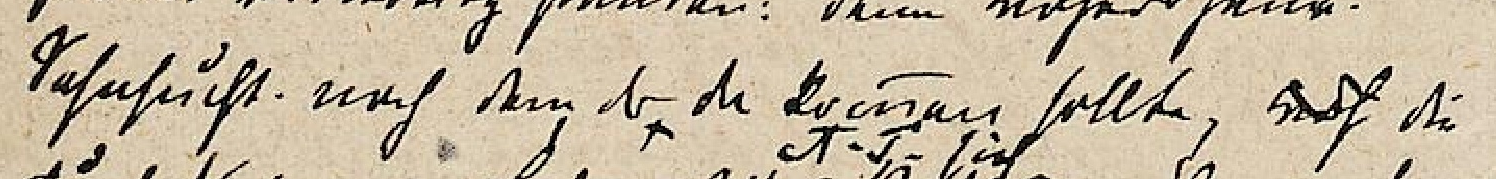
Sehnsucht nach dem, dr da komen sollte, nach die
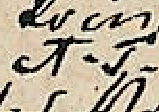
A.T.
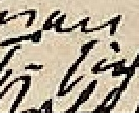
sich
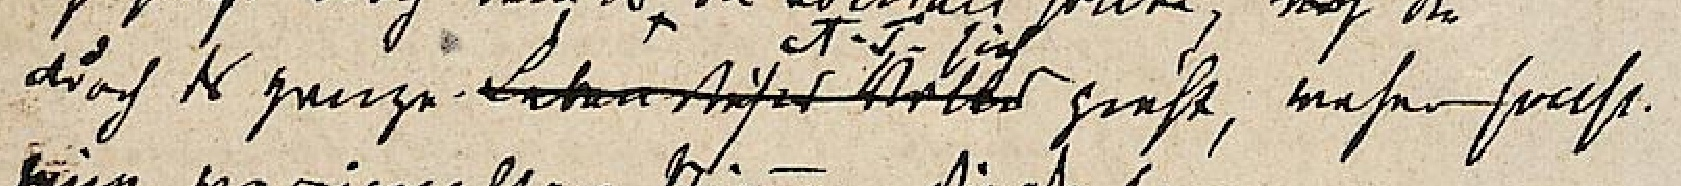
durch ds ganze Leben dieses Volkes zieht, woher sonst
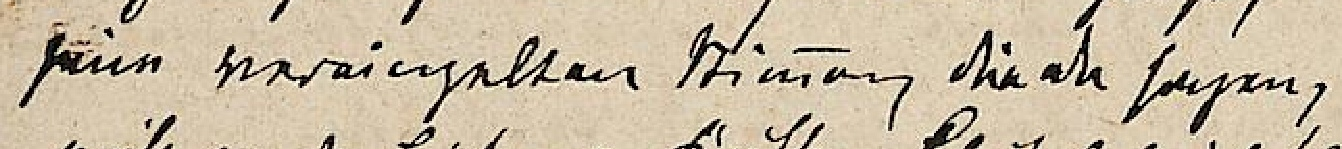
jene vereinzelten Stimen, die da sagen,
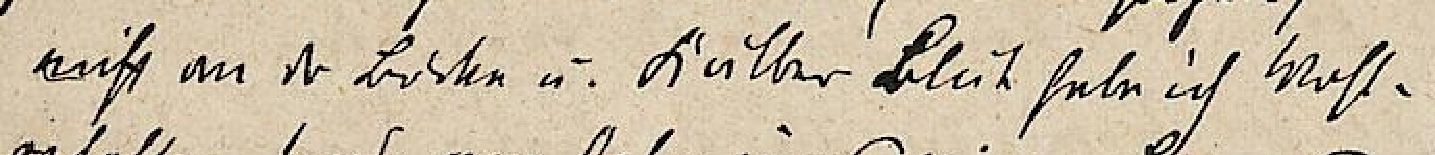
nicht an dr Böcken u. Kälber Blut habe ich Wohl¬
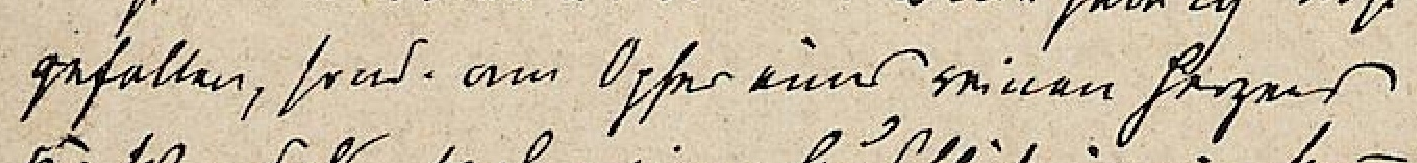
gefallen, sond. am Opfer eins reinen Herzens
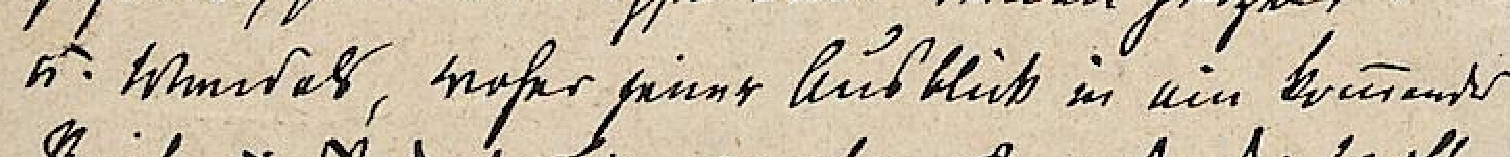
u. Wandels, woher jener Ausblick in ein komendes
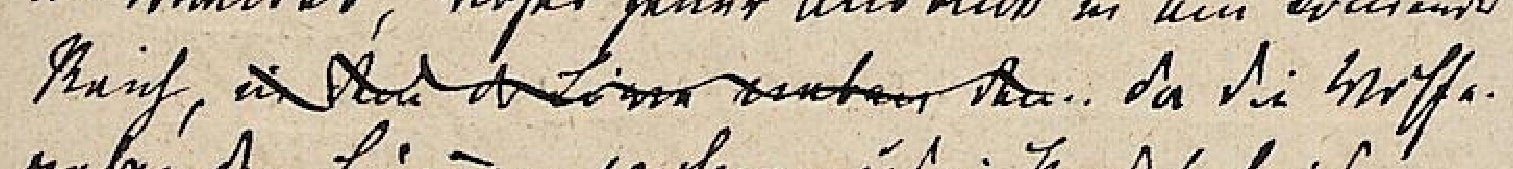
Reich, in das Lamm neben dem da die Wölfe
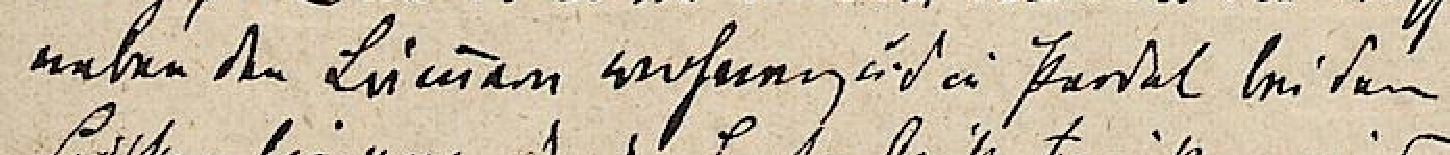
neben den Lämern wohnen, u. die Perdel bei den
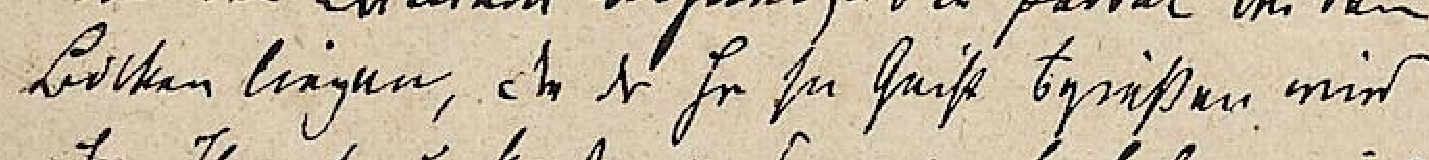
Böcken liegen, da der Hr sn Geist sgießen wird
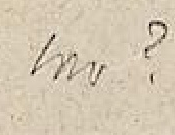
wo?
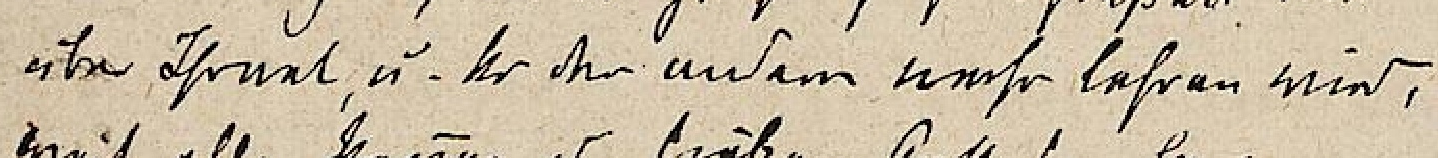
über Israel u kr den andern mehr lehren wird,
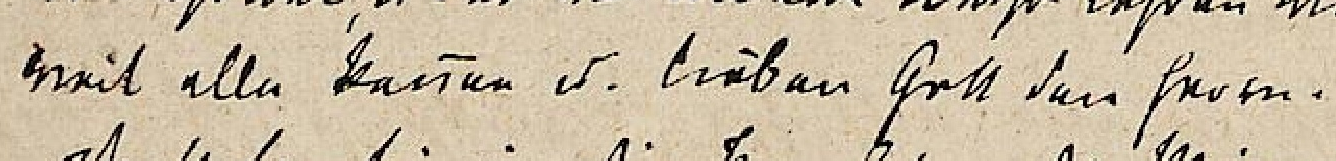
weil alle kemen u. lieben Gott den Herrn.
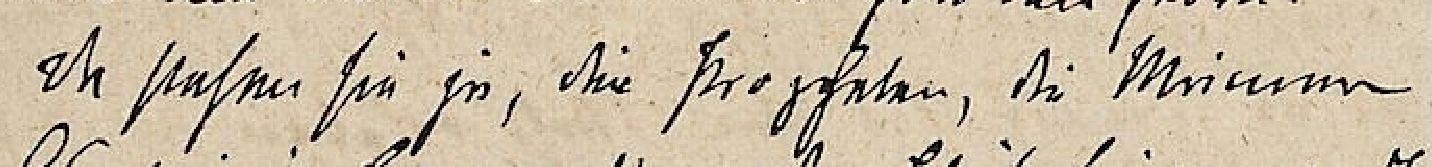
da stehen sie ja, die Propheten, die Männer
